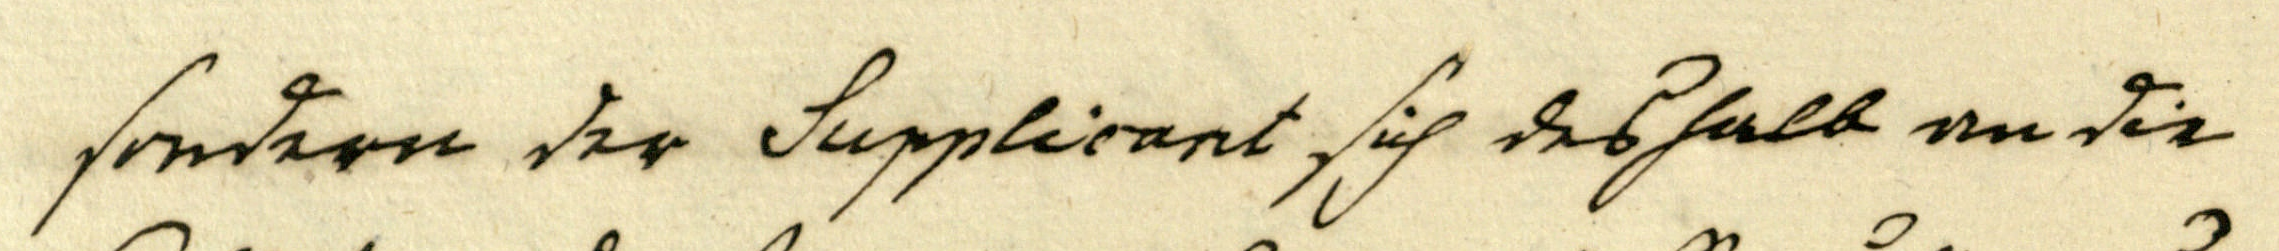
sondern der Supplicant sich deshalb an die
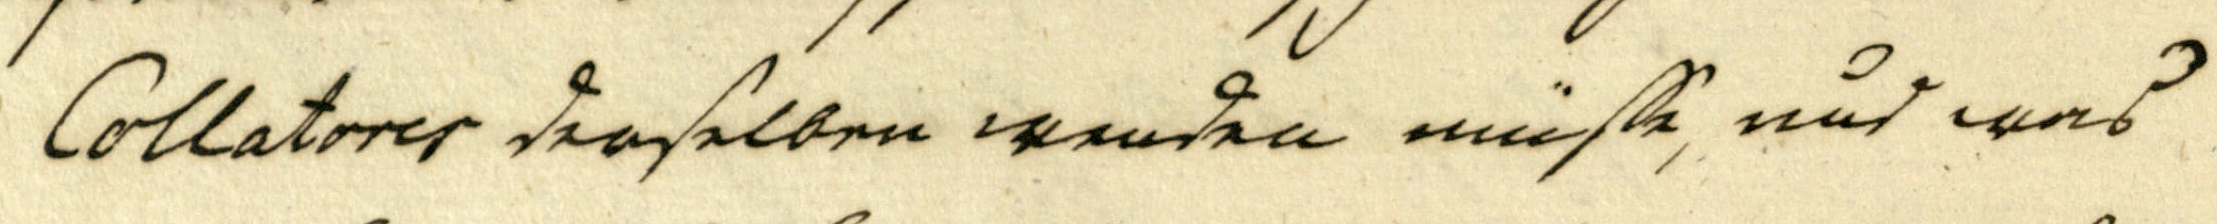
Collatores derselben wenden müsse, und was
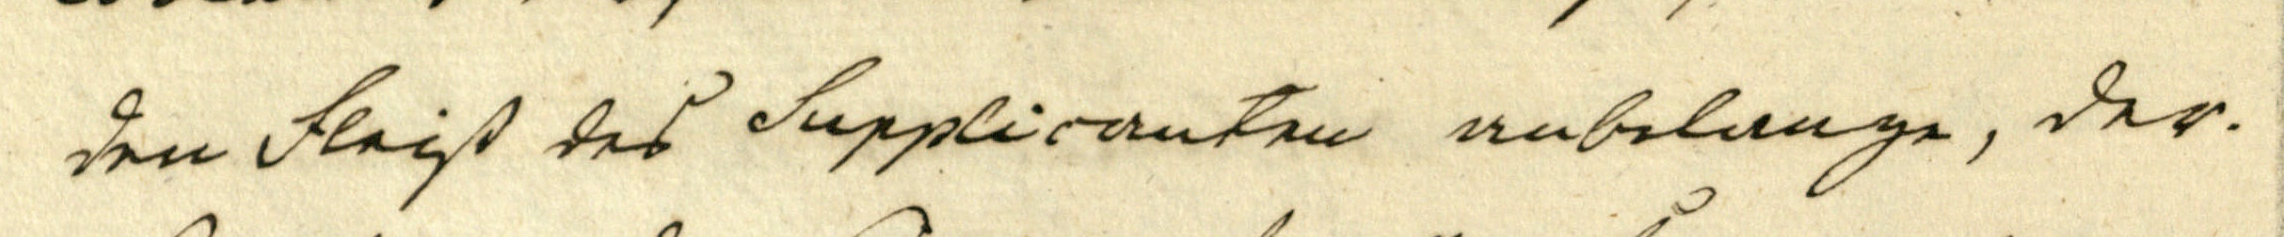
den Fleiß des Supplicanten anbelange, der¬
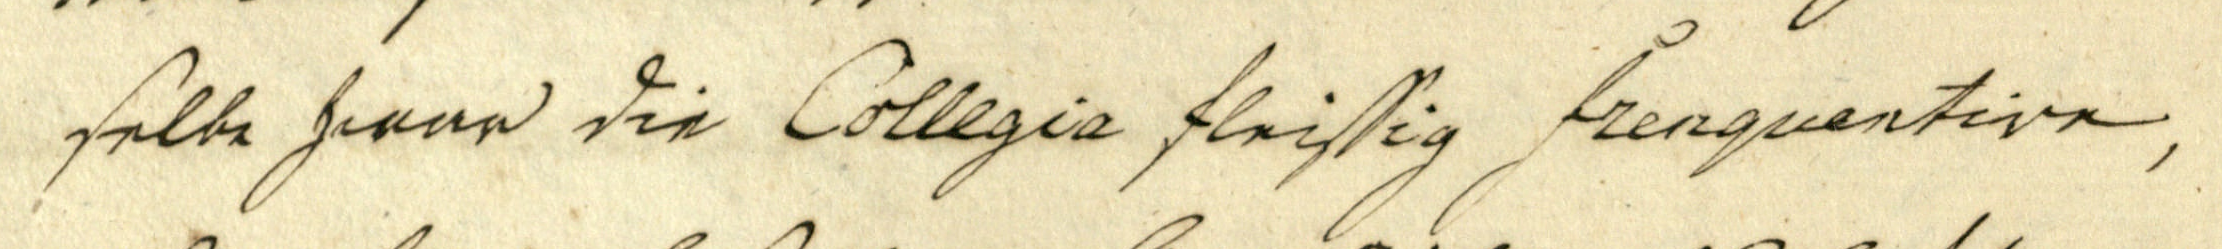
selbe zwar die Collegia fleissig frequentire,
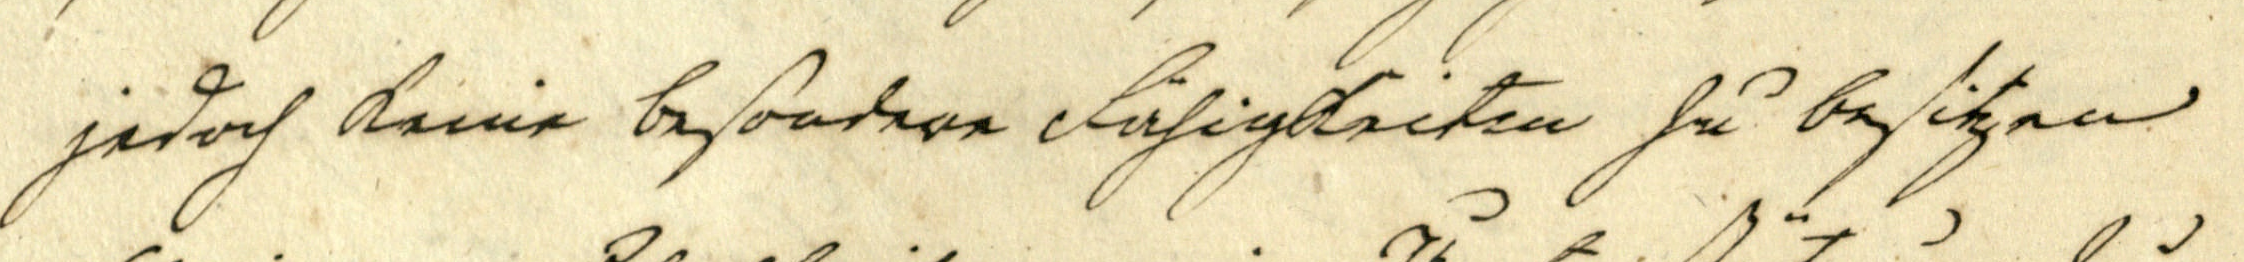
jedoch keine besondern Fähigkeiten zu besitzen
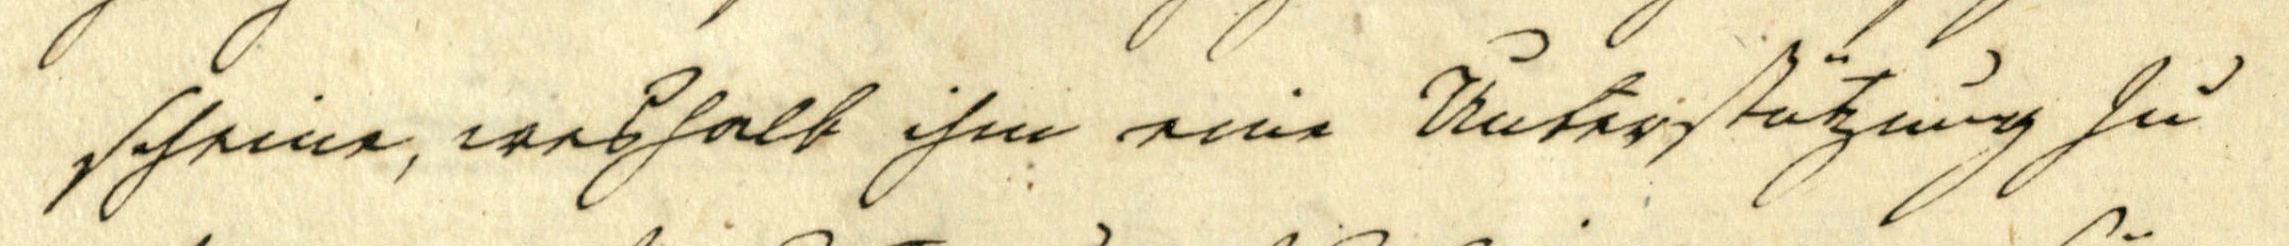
scheine, weshalb ihm eine Unterstützung zu
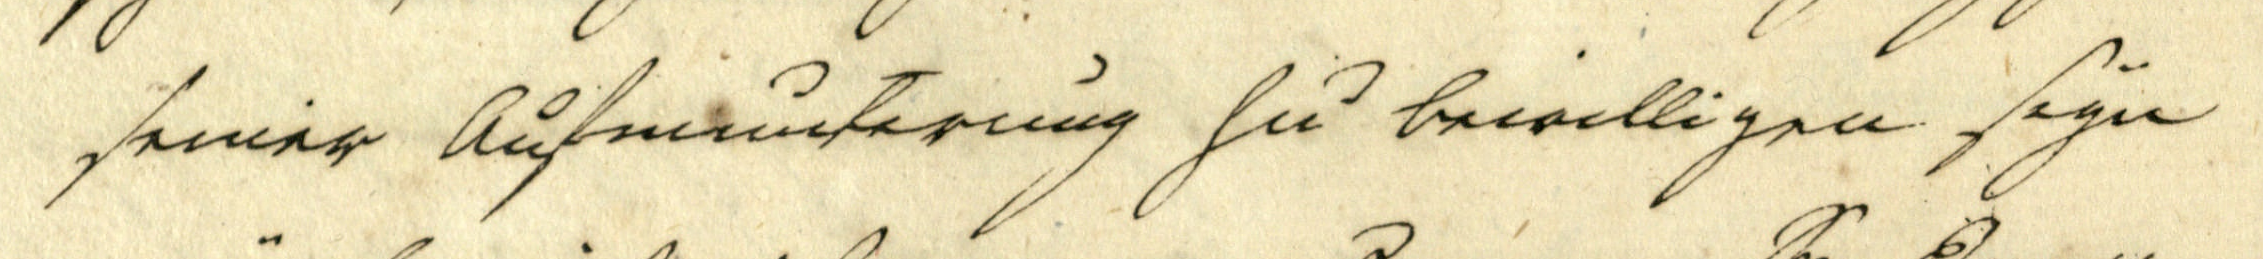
seiner Aufmunterung zu bewilligen seÿn
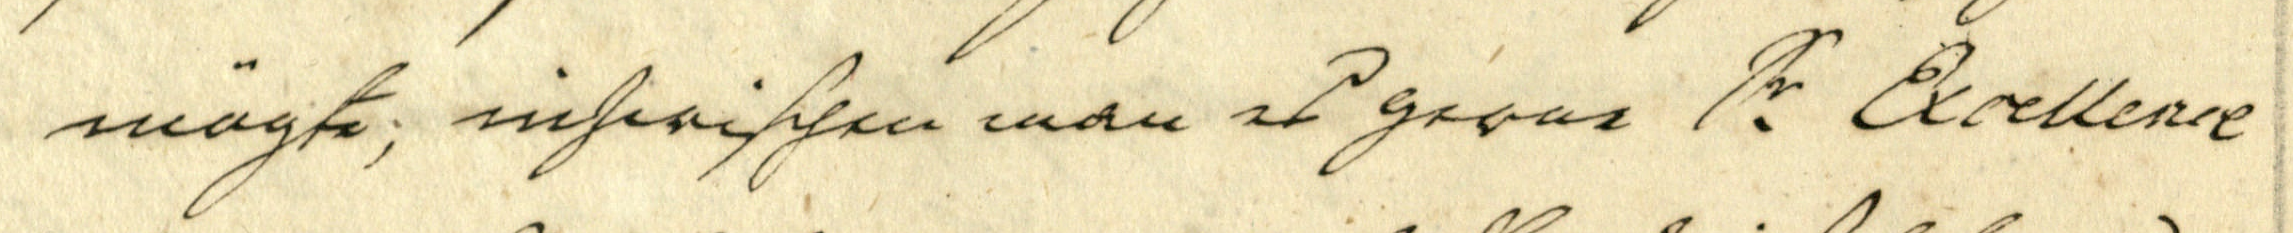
mögte; inzwischen man es gerne Sr. Excellence
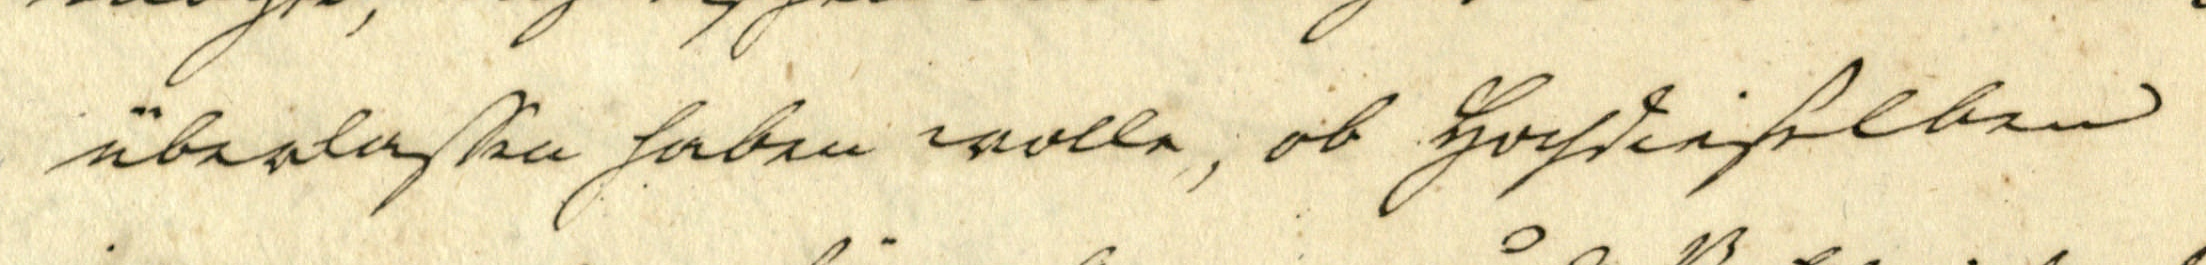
überlassen haben wolle, ob Hochdieselben
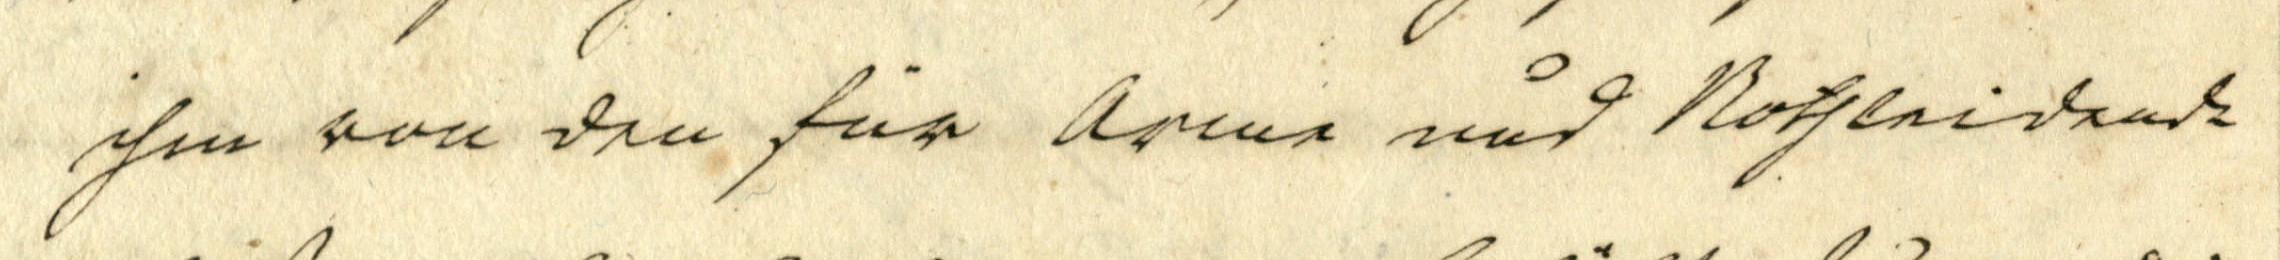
ihm von den für Arme und Nothleidende
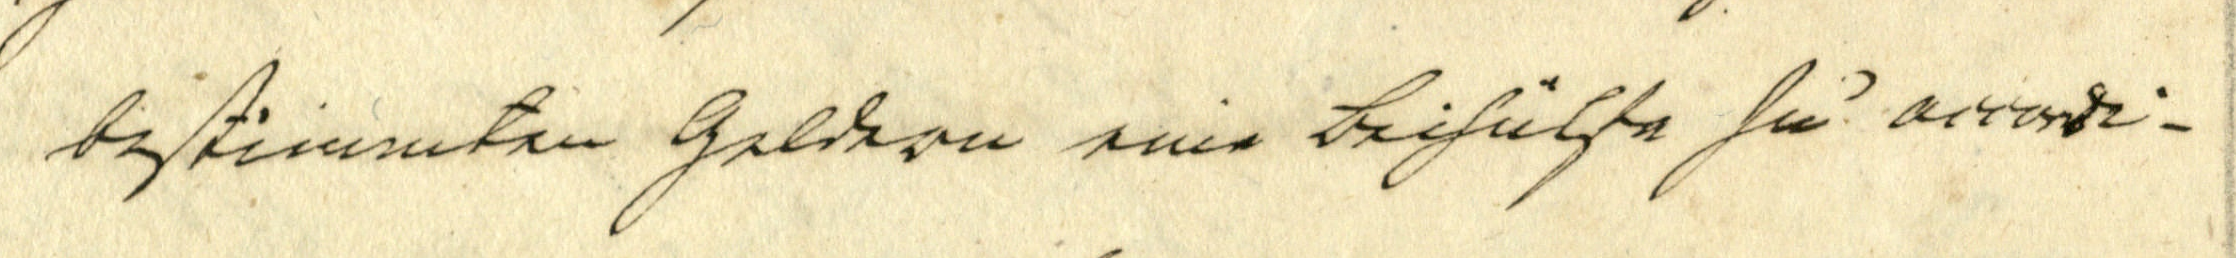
bestimmten Geldern eine Beihülfe zu accordi¬
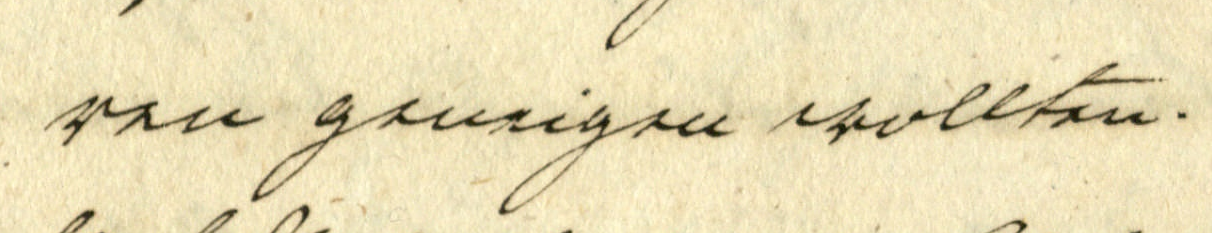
ren geneigen wollten.
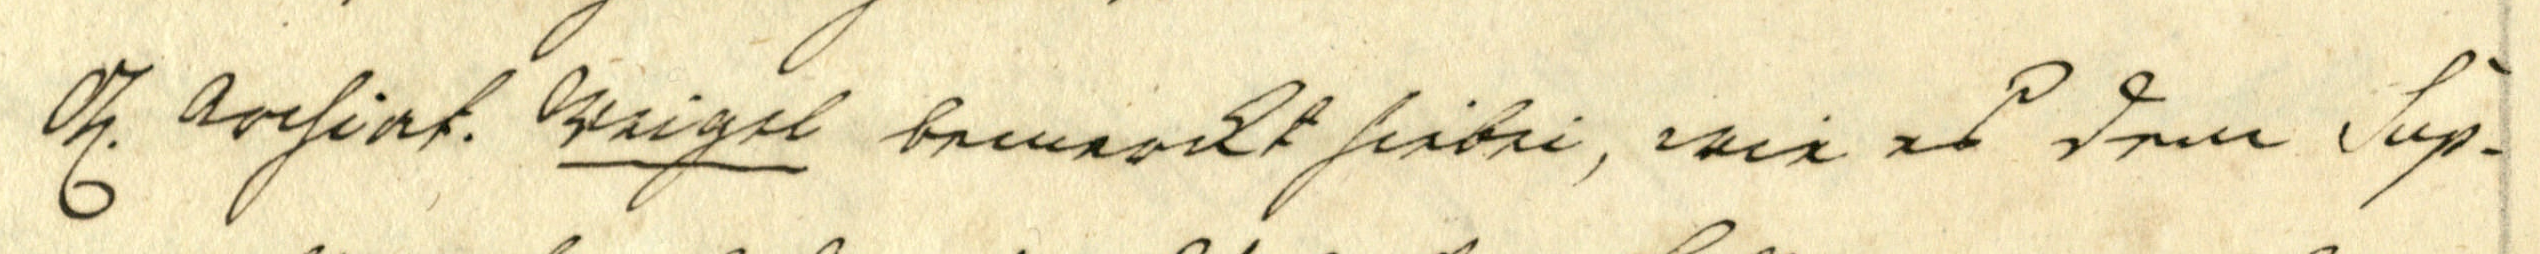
dh. Archiat. Weigel bemerckt hiebei, wie es dem Sup¬
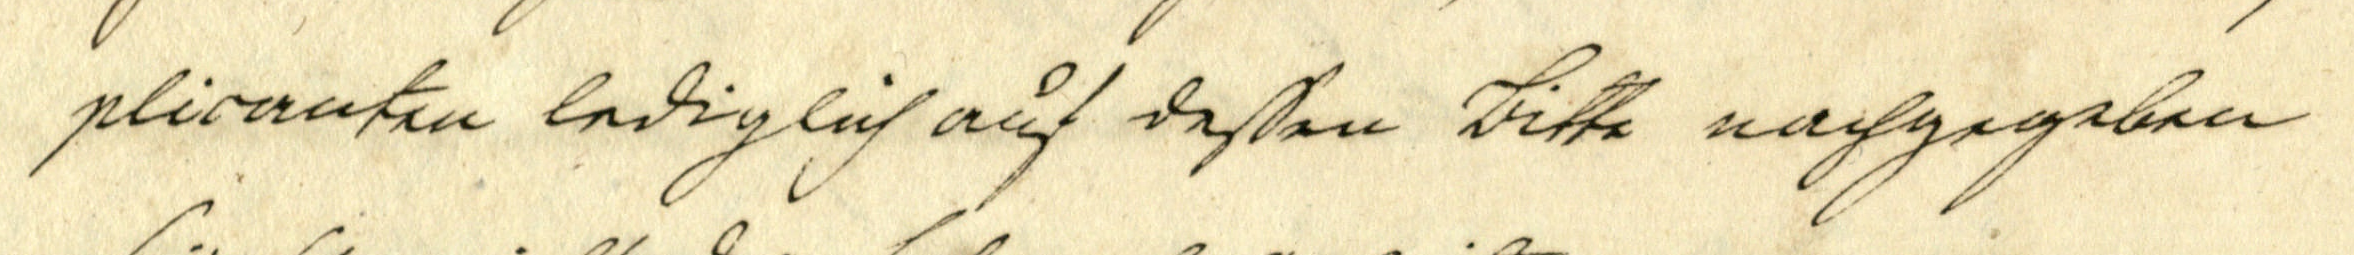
plicanten lediglich auf dessen Bitte nachgegeben
